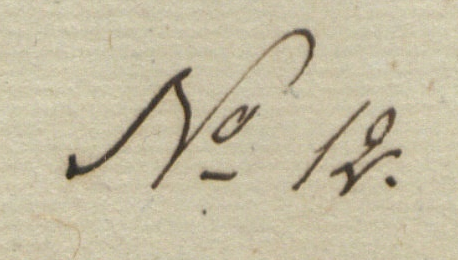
No 12.
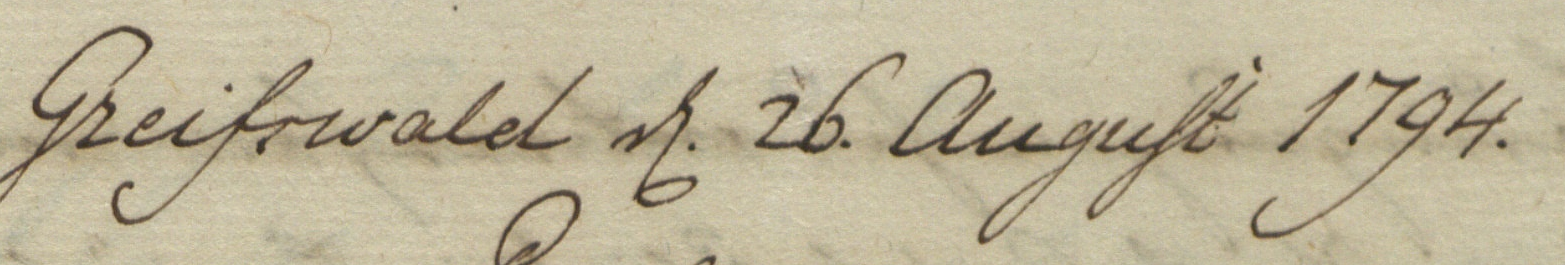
Greifswald d. 26. August 1794.
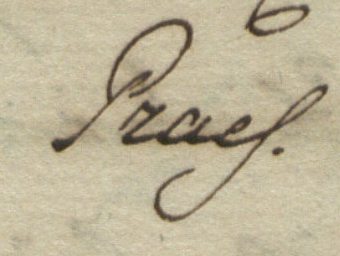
Praes.
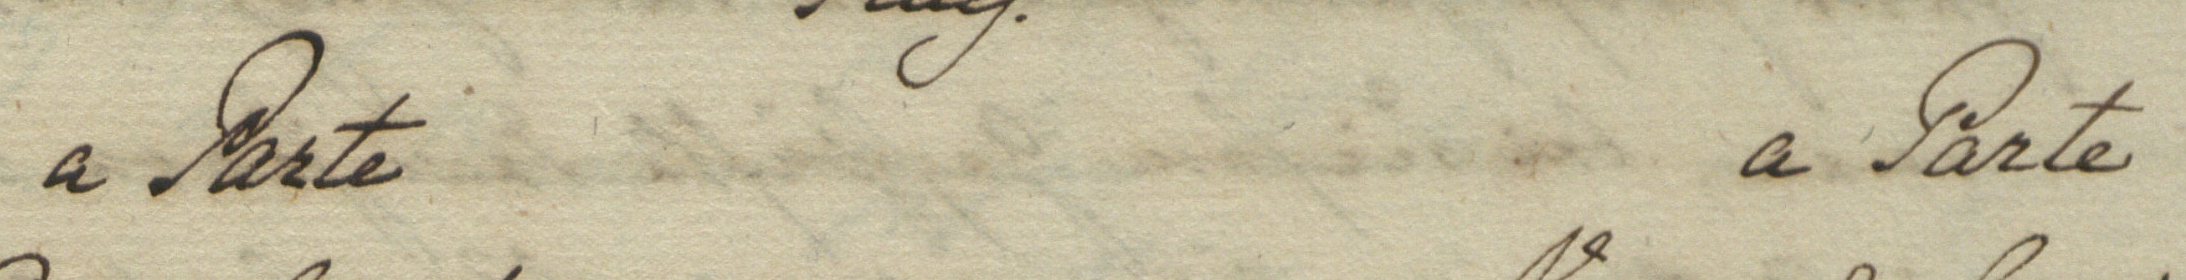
a Parte a Parte
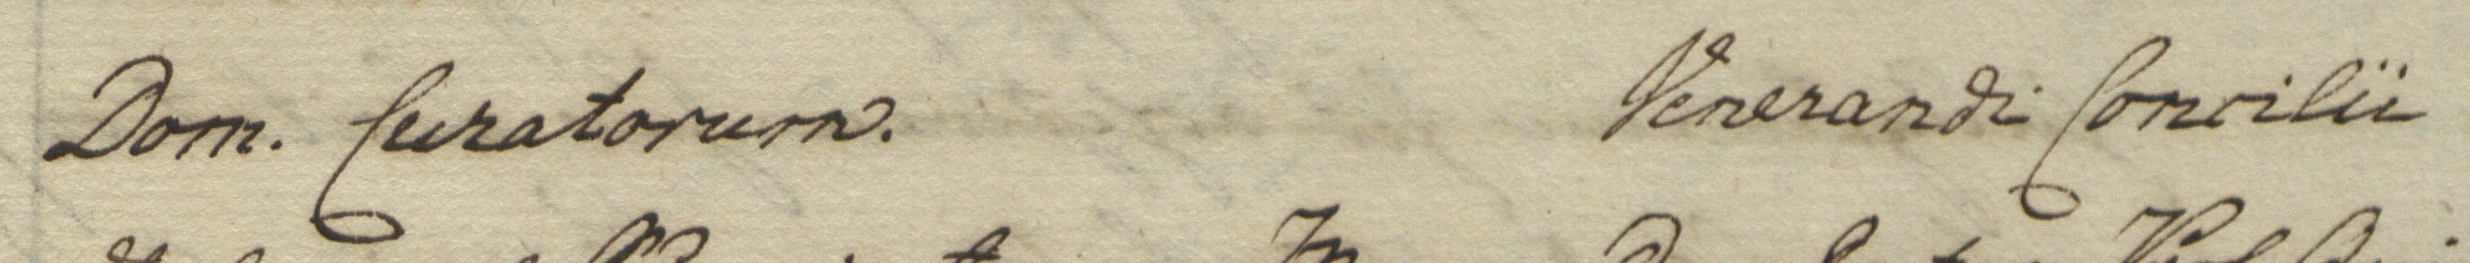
Dom. Curatorum. Venerandi Concilii
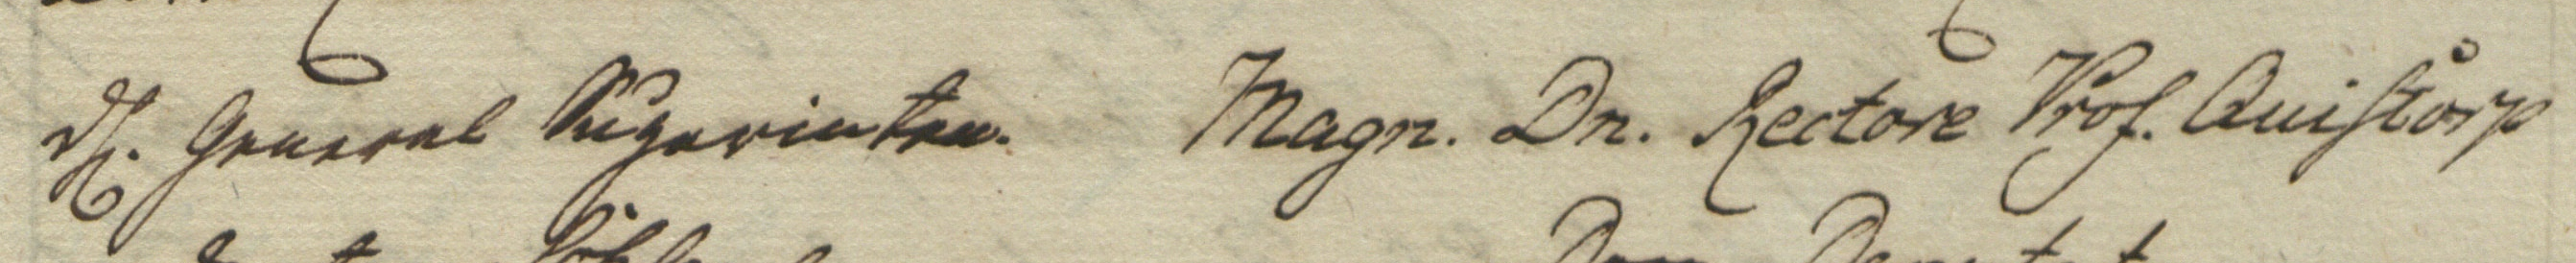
dh. General Superinten¬ Magn. Dn. Rector Prof. Quistorp
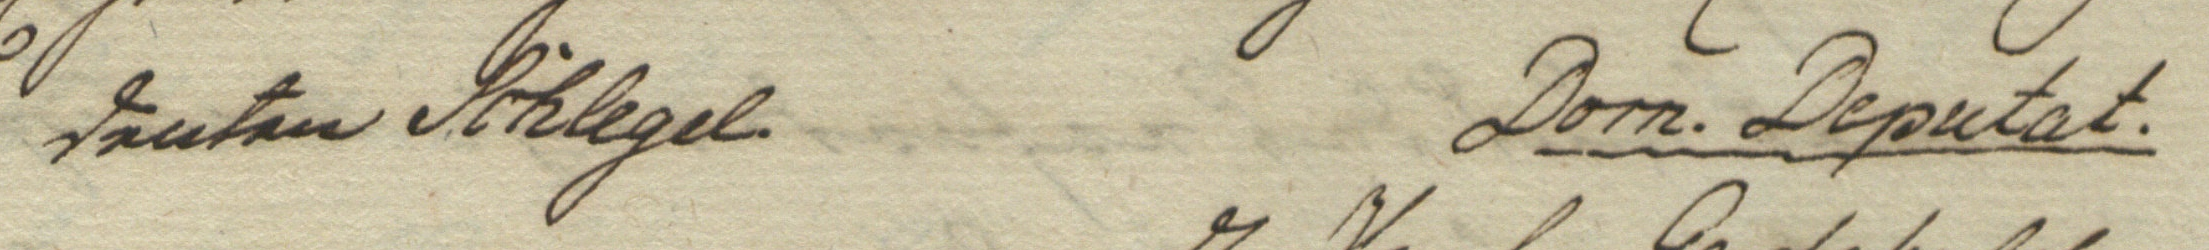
denten Schlegel. Dom. Deputat.
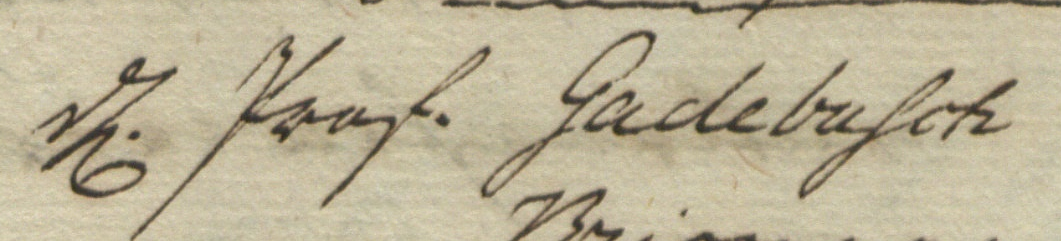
dh. Prof. Gadebusch
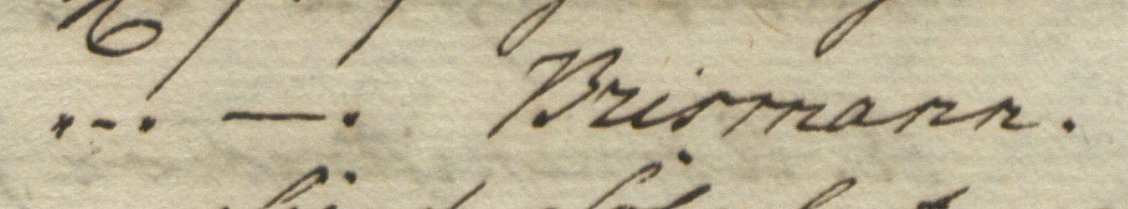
Brismann.
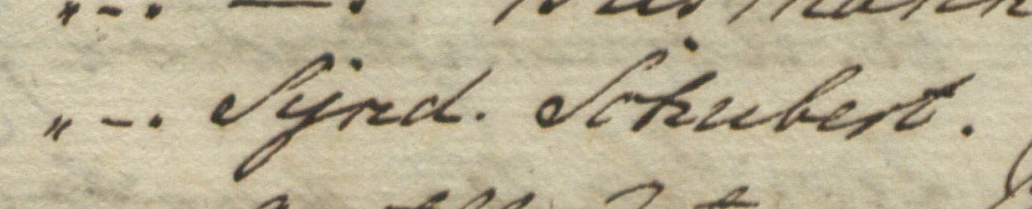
Sÿnd. Schubert.
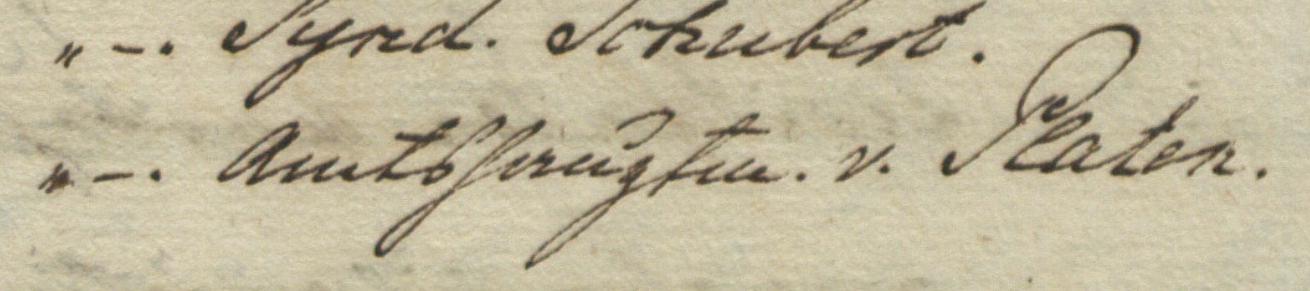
Amtshauptm. v. Platen.
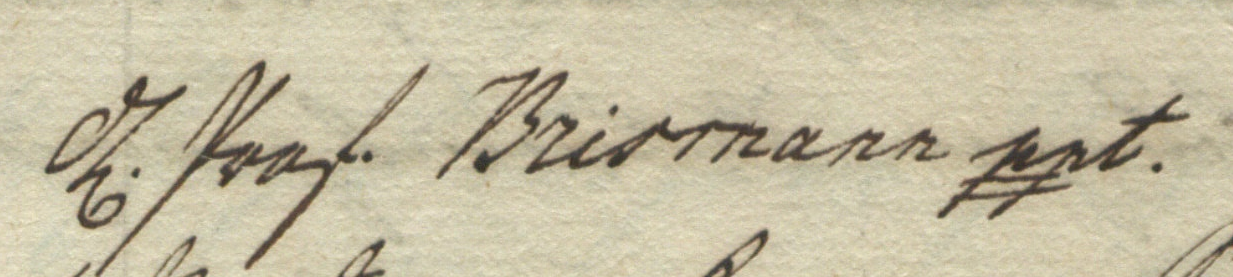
dh. Prof. Brismann ppt.
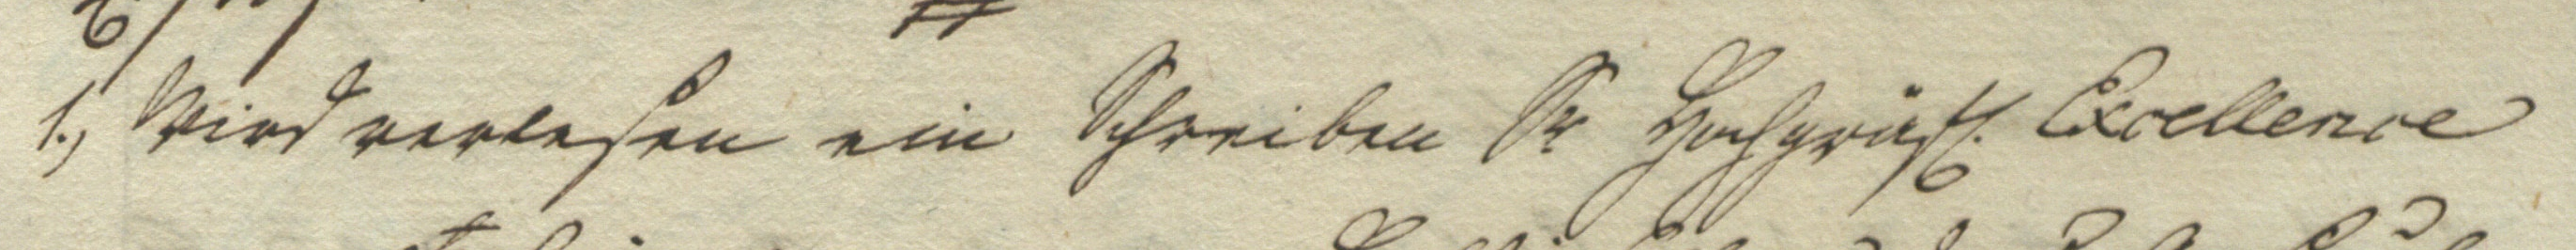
1, Wird verlesen ein Schreiben Sr Hochgräfl. Excellence
